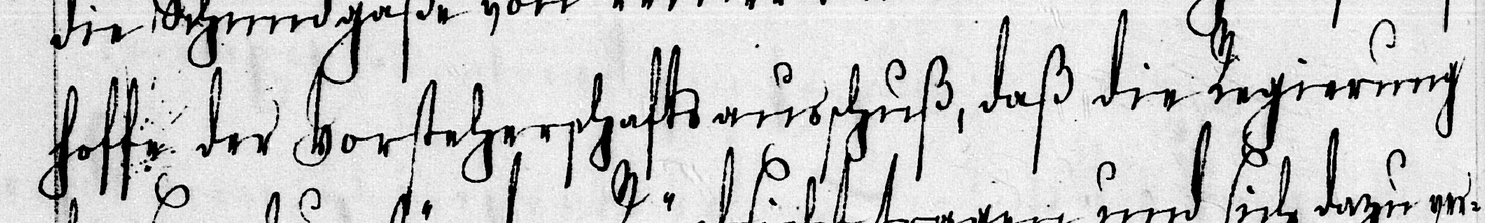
hoffe der Vorsteherschaftsausschuß, daß die Regierung
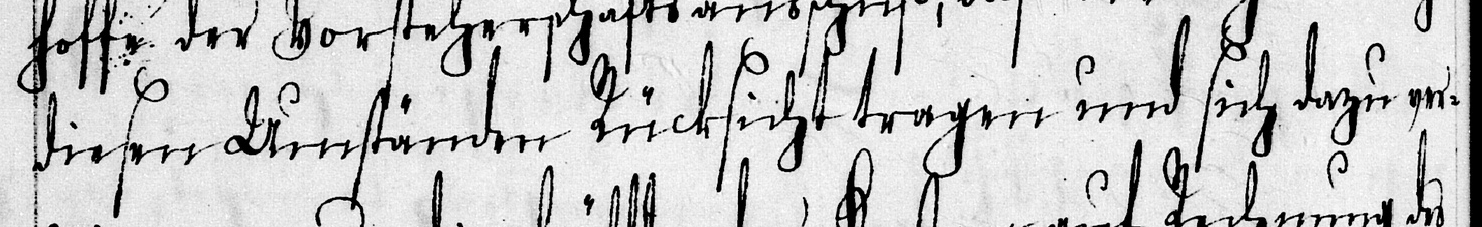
diesen Umständen Rücksicht tragen und sich dazu ve¬
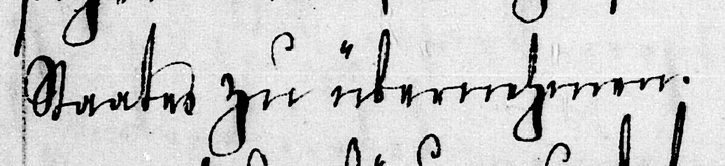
Staates zu übernehmen.
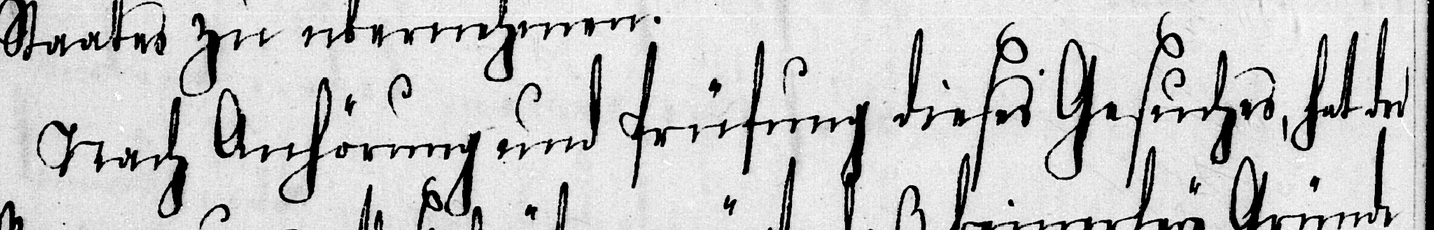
Nach Anhörung und Prüfung dieses Gesuches, hat
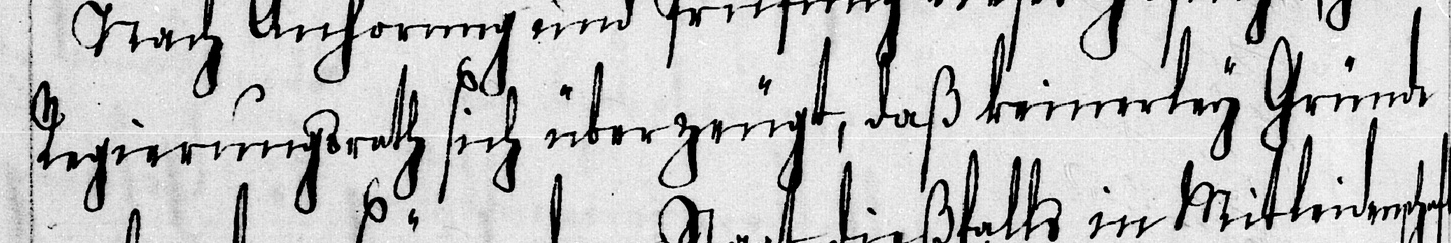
Regierungsrath sich überzeugt, daß keinerley Gründe
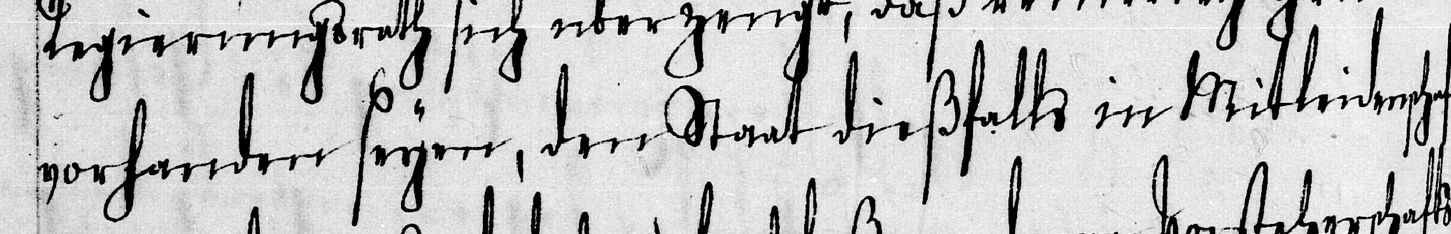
vorhanden seyen, den Staat dießfalls in Mitleiden¬
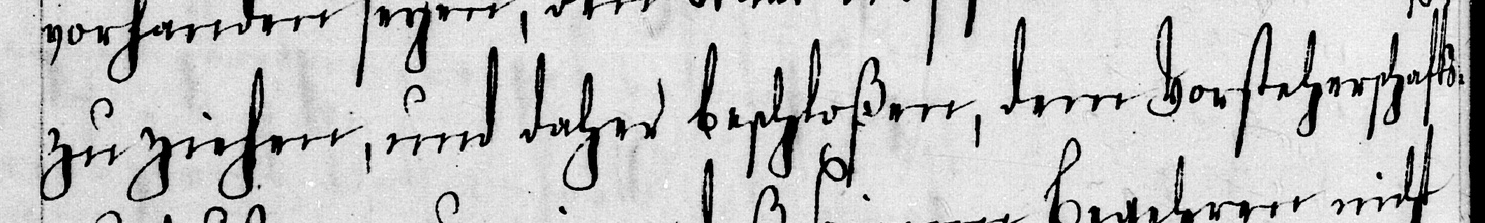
zu ziehen, und daher beschloßen, dem Vorsteherschaf¬
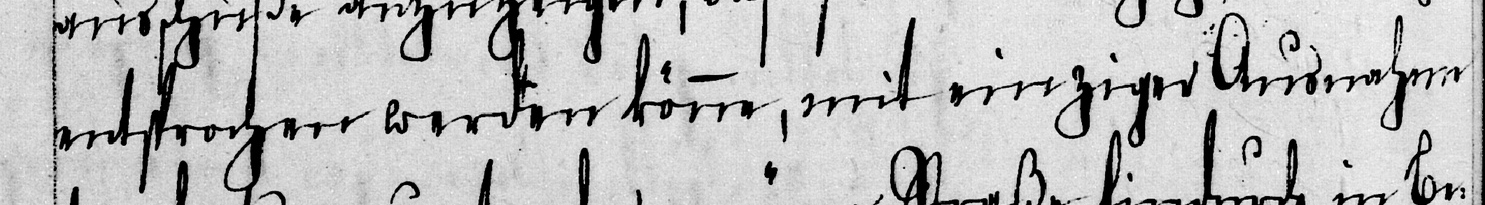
entsprochen werden könne, mit einziger Ausnahme
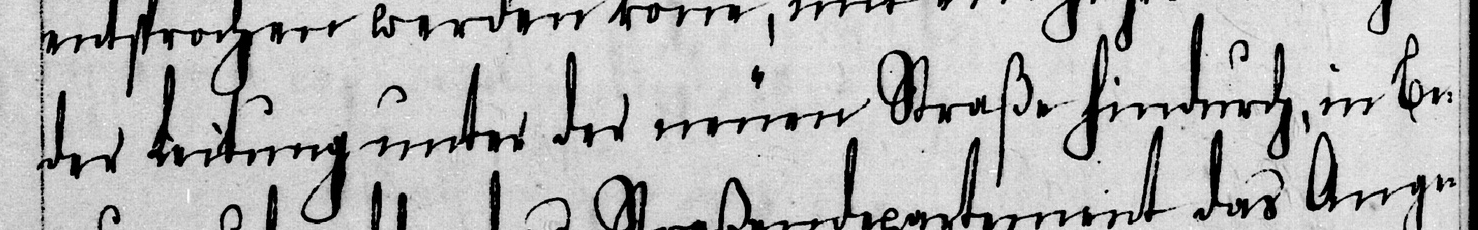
der Leitung unter der neuen Straße hindurch, in Be¬
